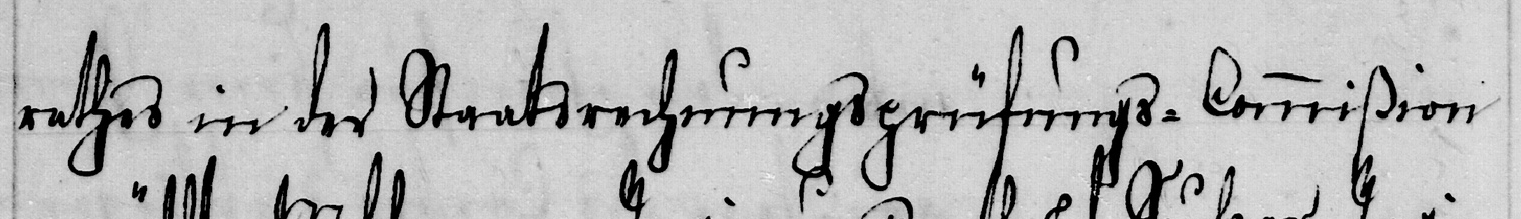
rathes in der Staatsrechnungsprüfungs-Commißion
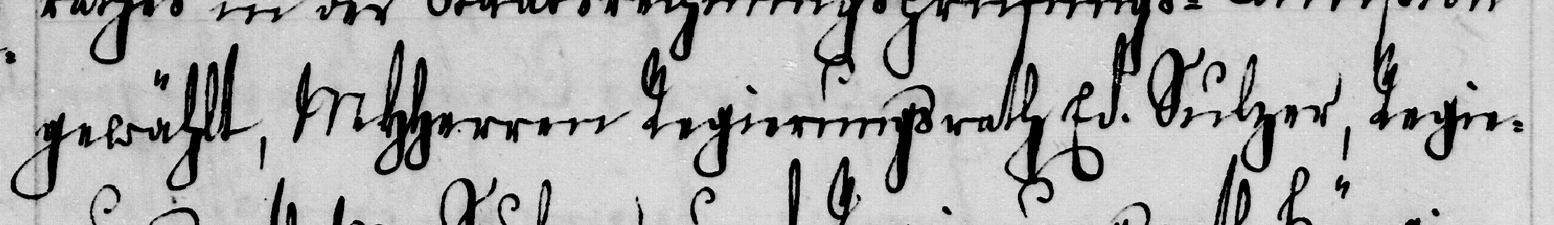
gewählt, MHHerren Regierungsrath Ed. Sulzer, Regie¬
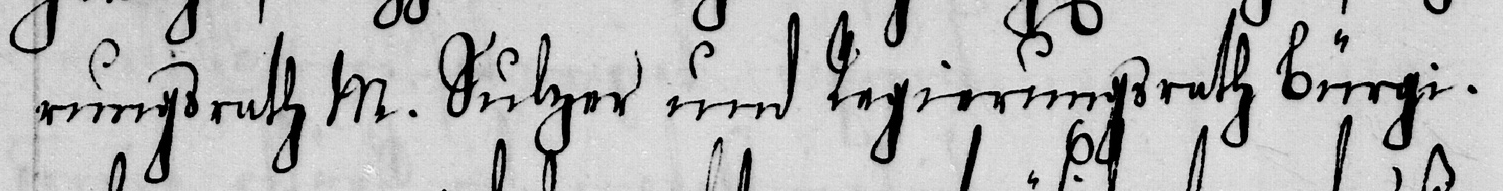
rungsrath M. Sulzer und Regierungsrath Bürgi.
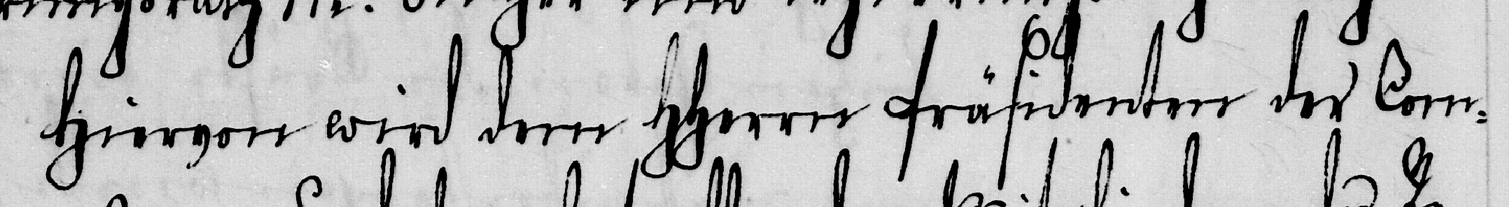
Hiervon wird dem HHerrn Präsidenten der Com¬
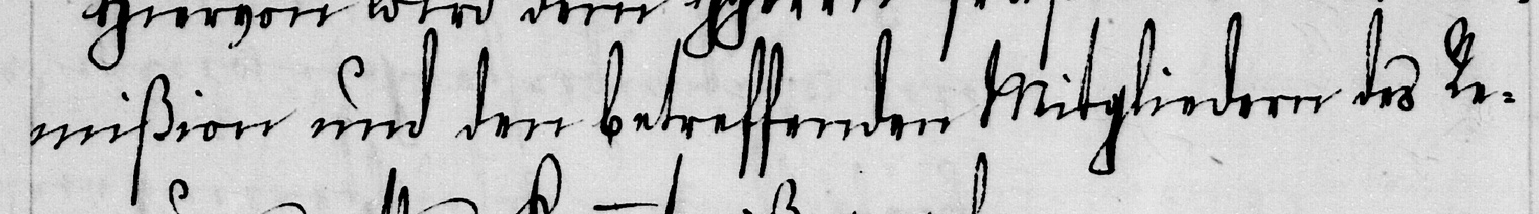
mißion und den betreffenden Mitgliedern des Re¬
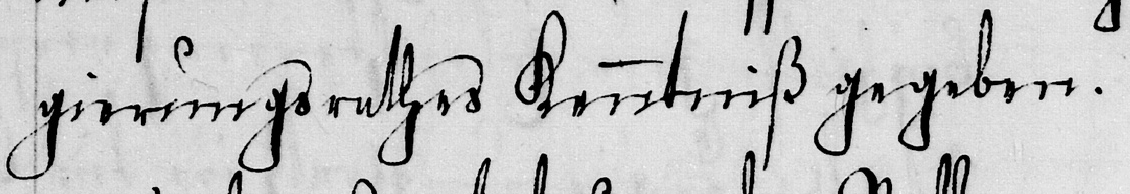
gierungsrathes Kenntniß gegeben.
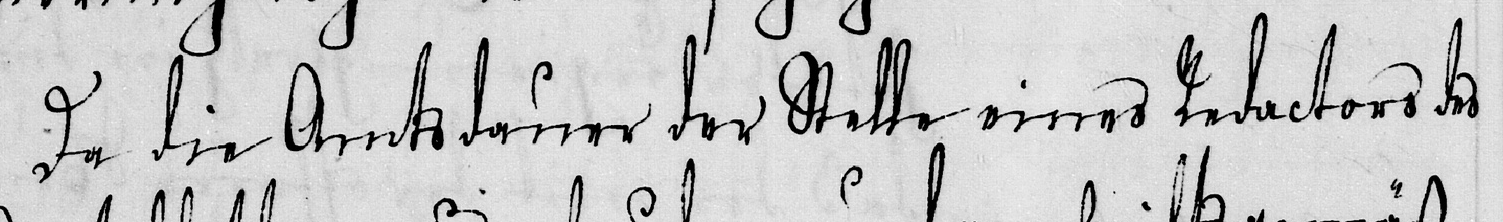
Da die Amtsdauer der Stelle eines Redactors d¬
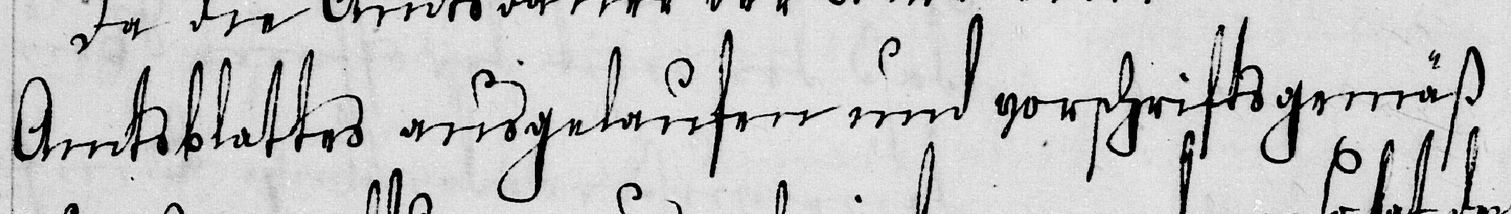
Amtsblattes ausgelaufen und vorschriftsgemäß
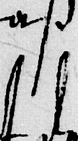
es
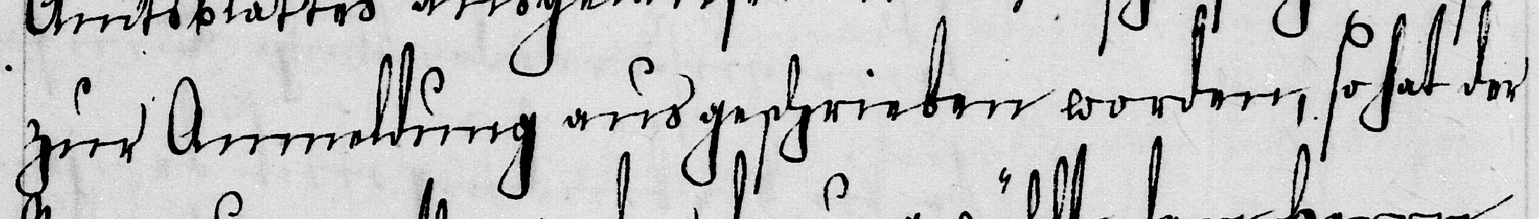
zur Anmeldung ausgeschrieben worden, so hat der
